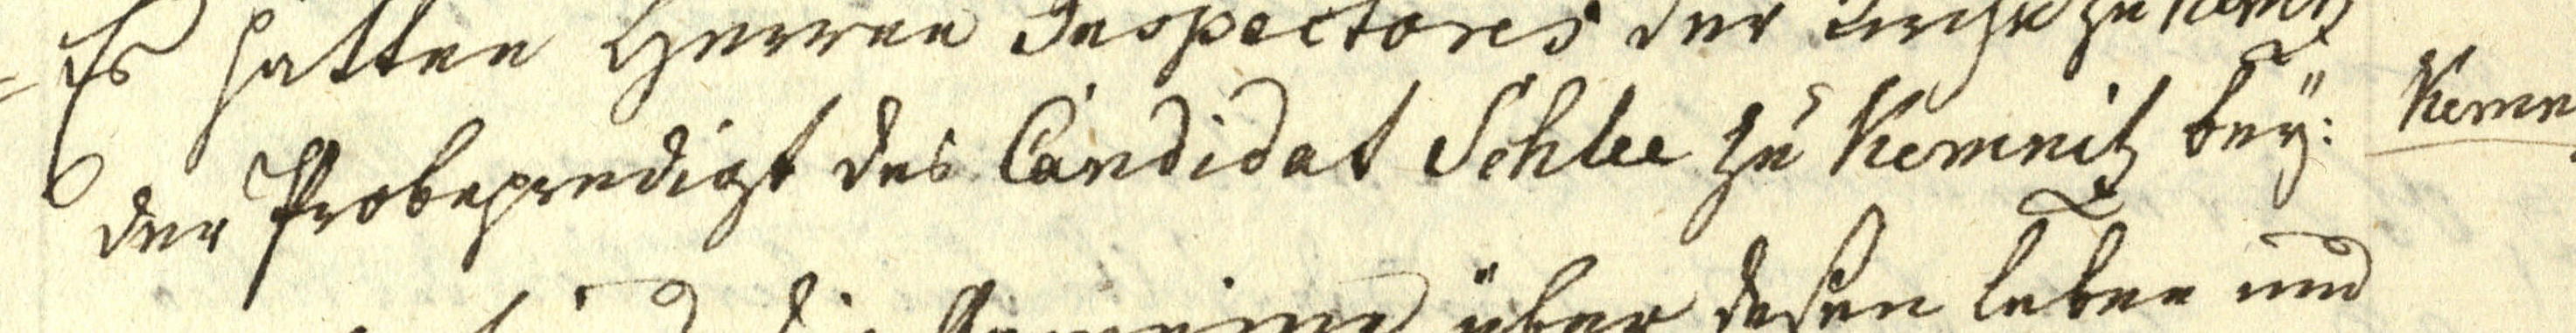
der Probepredigt des Candidat Schlee zu Kemnitz beÿ¬
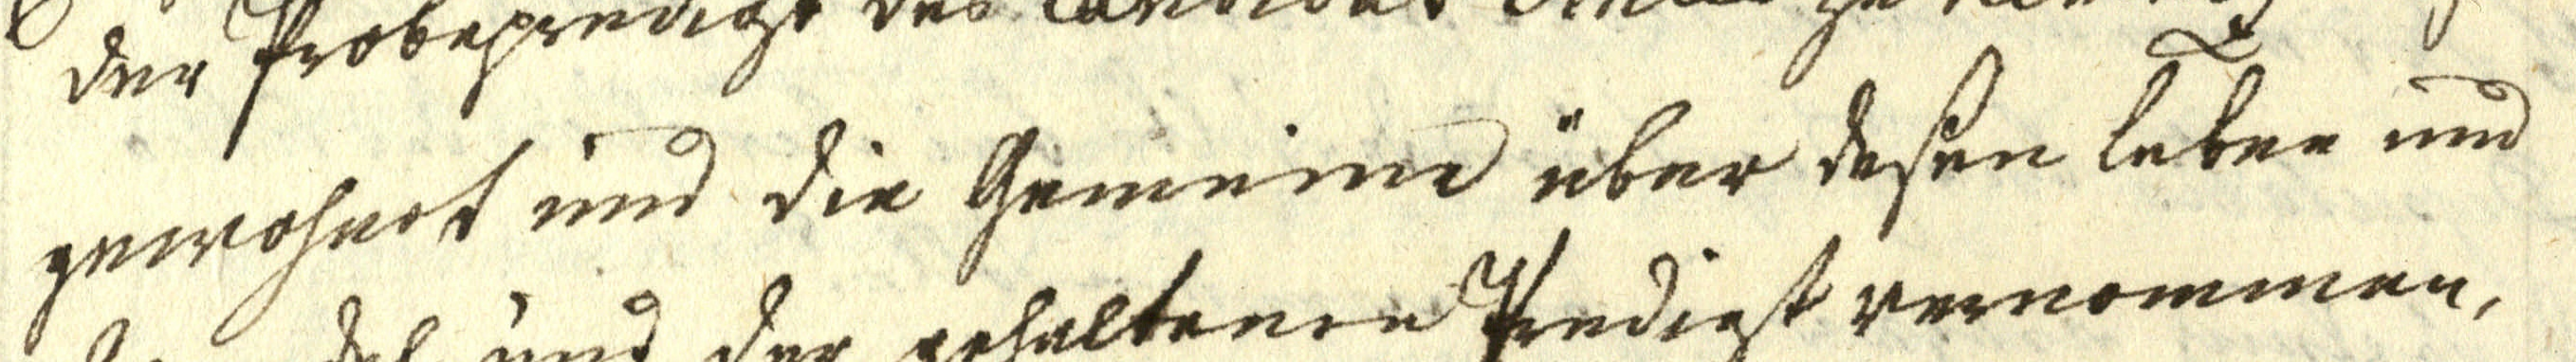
gewohnet und die Gemeine über deßen Leben und
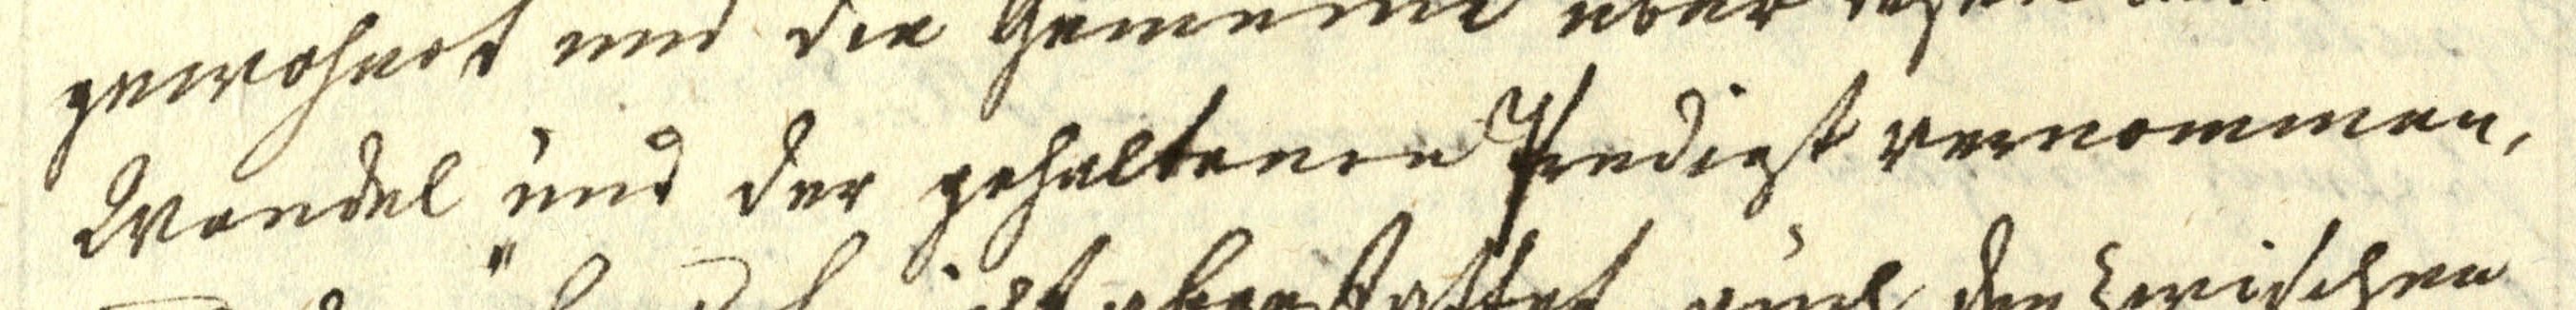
Wandel und der gehaltenen Predigt vernommen,
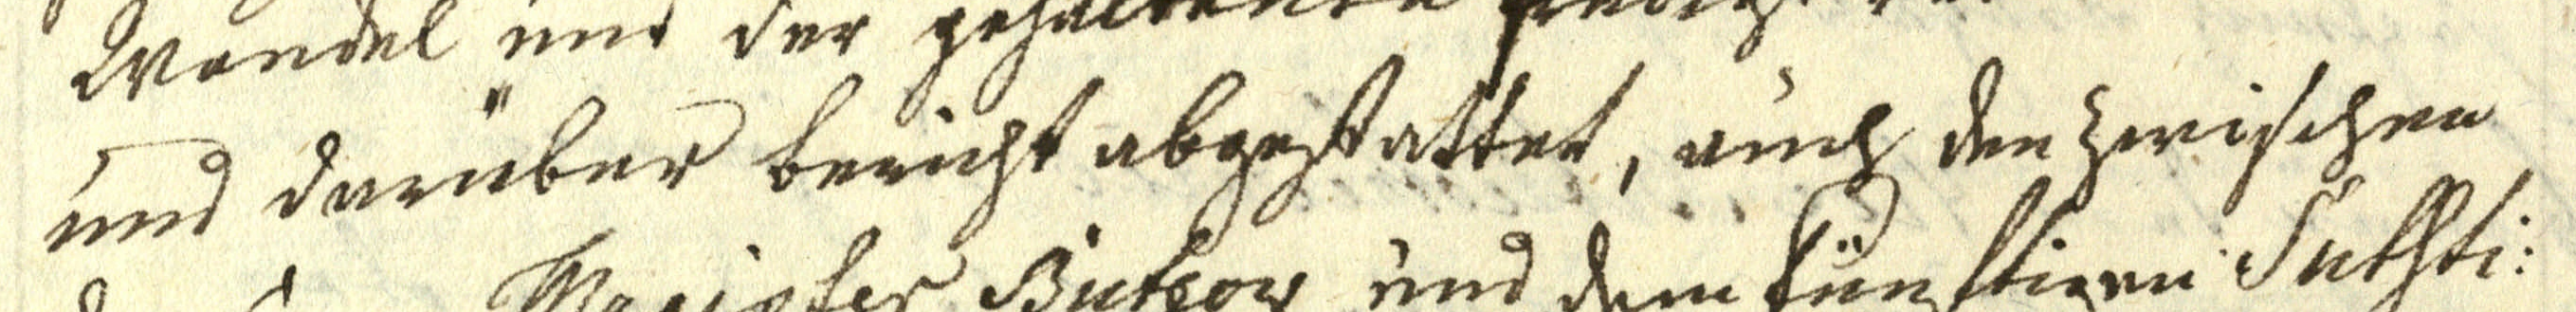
und darüber Bericht abgestattet, auch den zwischen
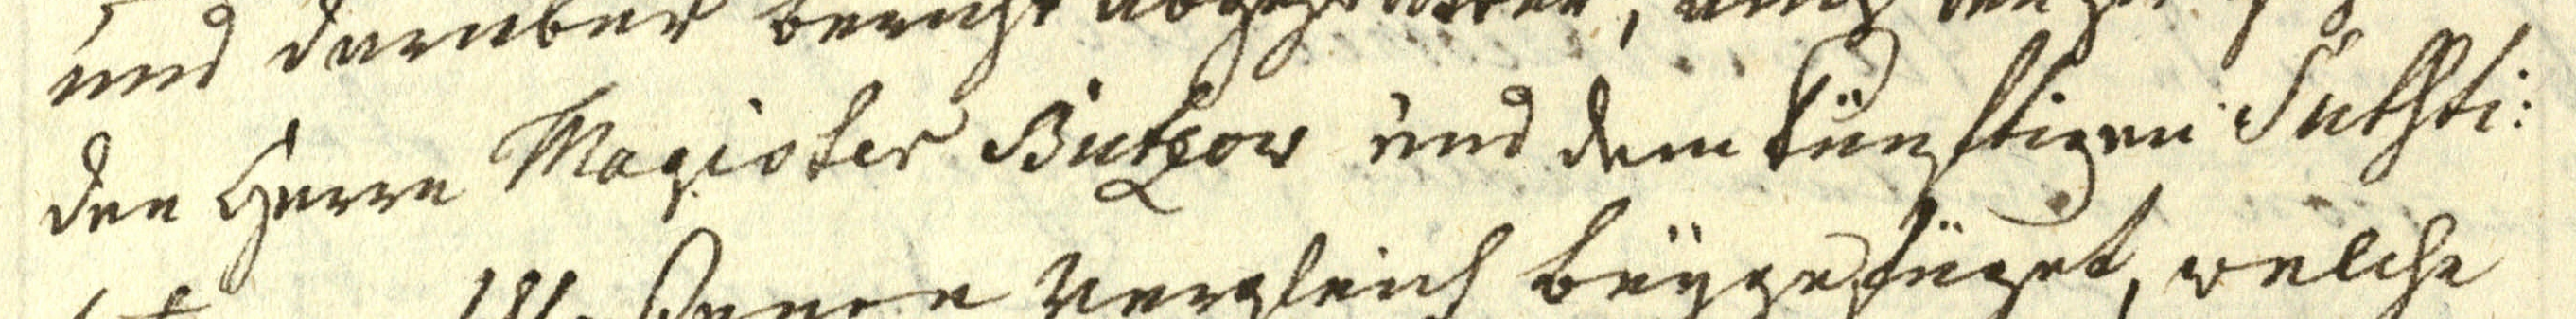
den Herrn Magister Bützow und dem künftigen Substi¬
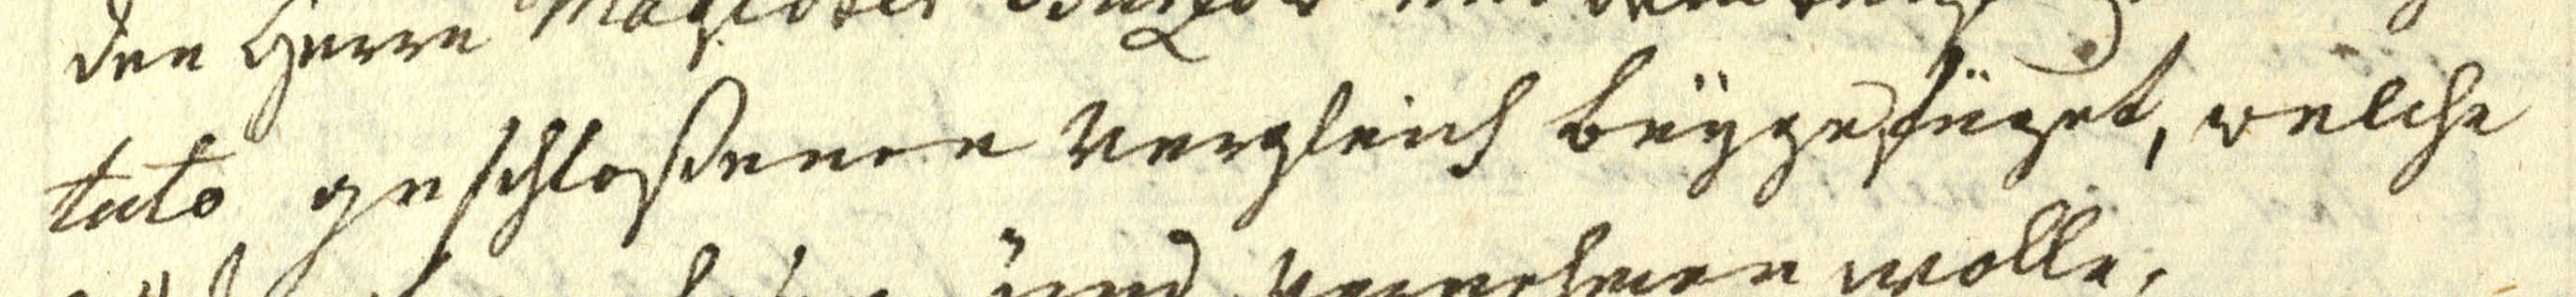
tuto geschloßenen Vergleich beÿgefüget, welche
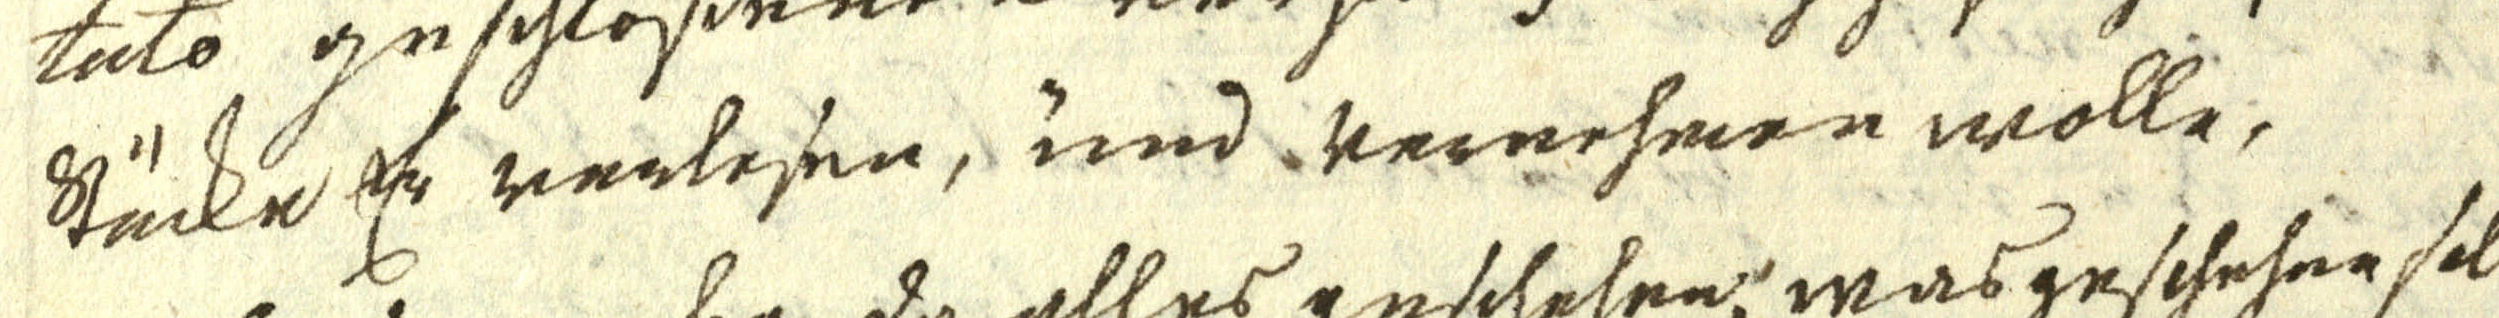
Stücke Er verlesen, und vernehmen wolle,
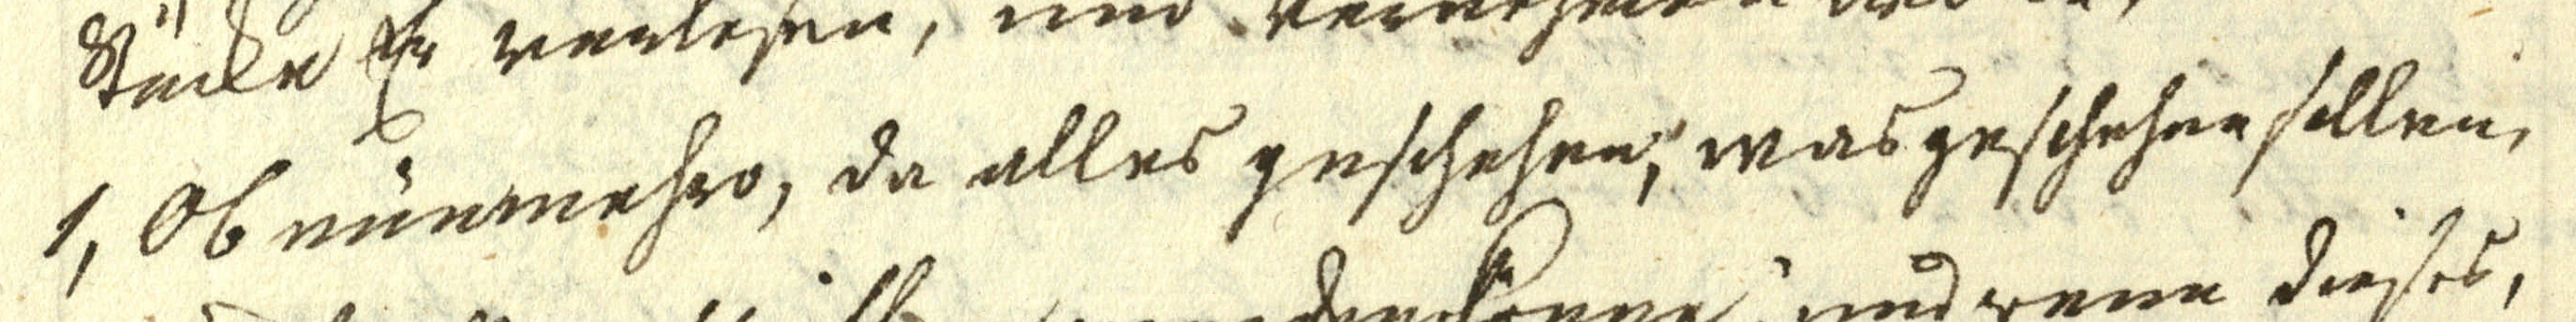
1, Ob nunmehro, da alles geschehen was geschehen sollen.
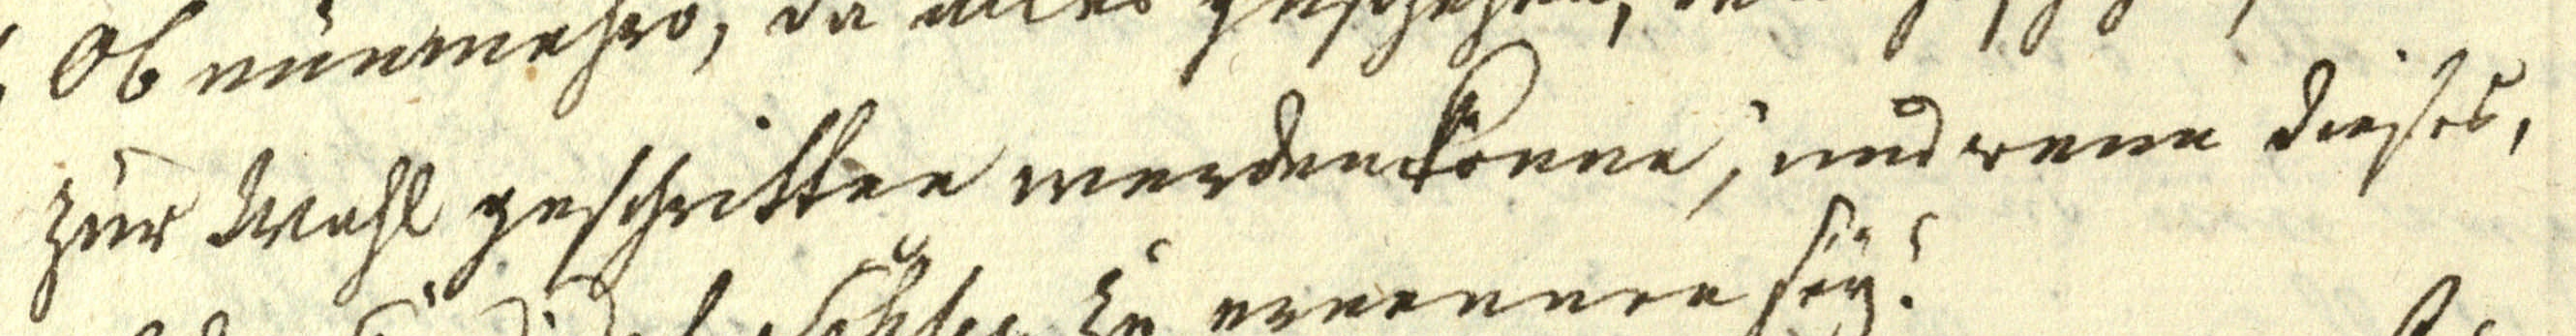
zur Wahl geschritten werden könne, und wenn dieses,
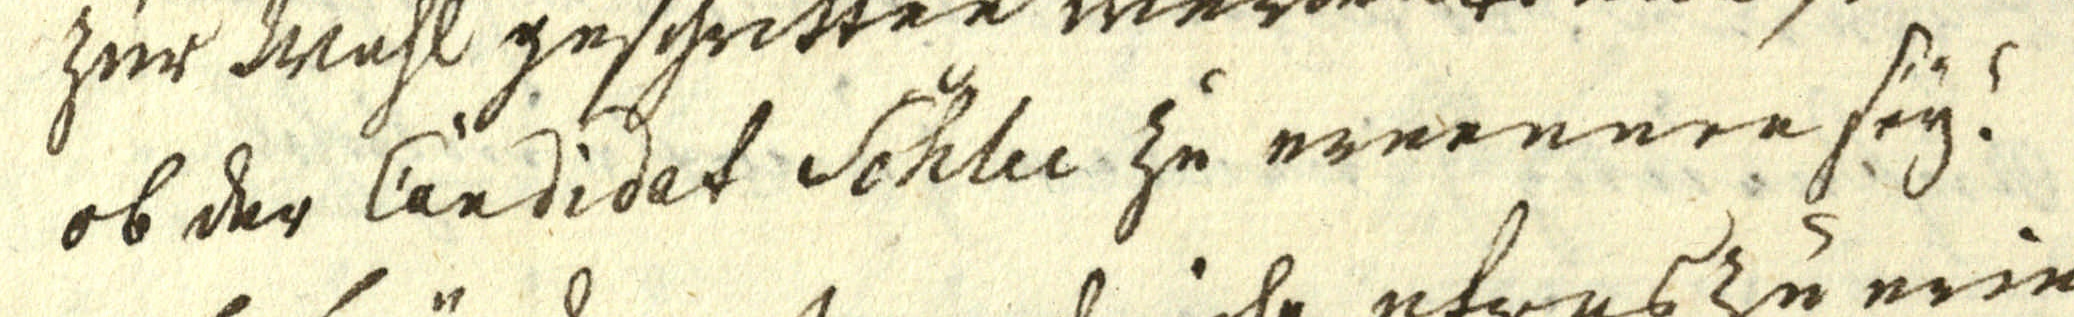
ob der Candidat Schlee zu ernennen seÿ?
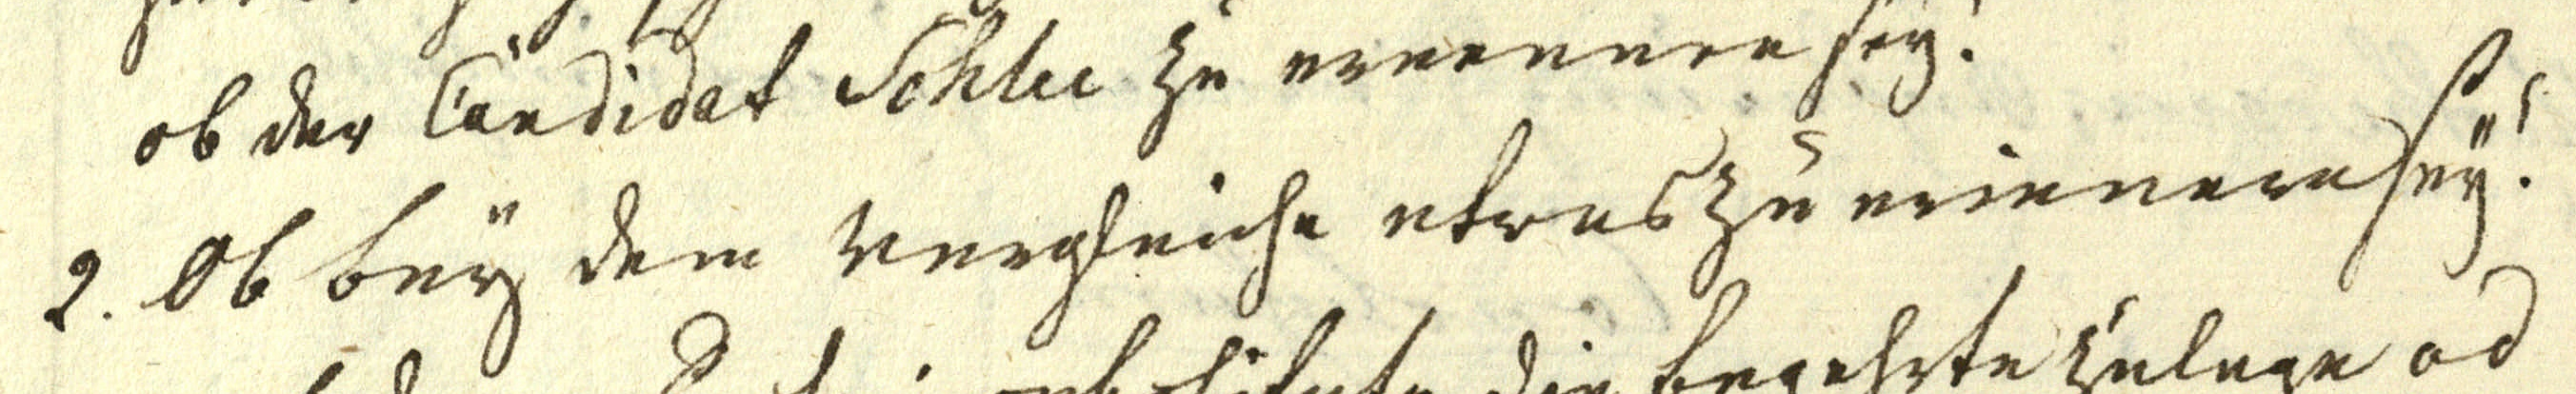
2. Ob beÿ dem Vergleiche etwas zu erinnern seÿ?
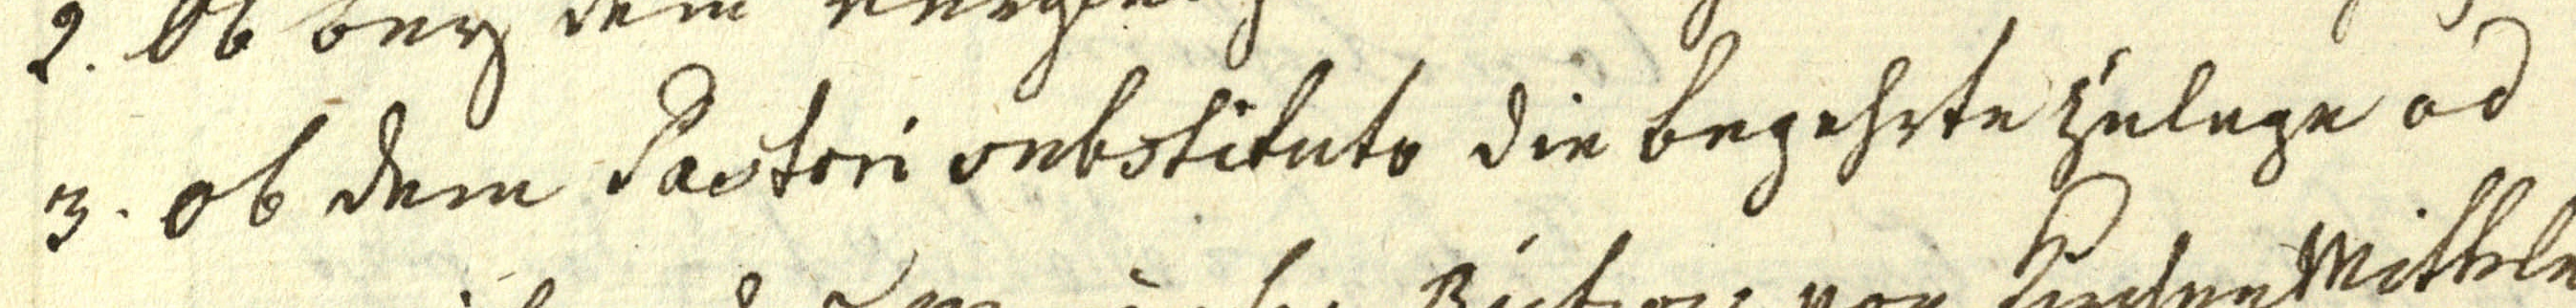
3. Ob dem Pastori substituto die begehrte Zulage ad
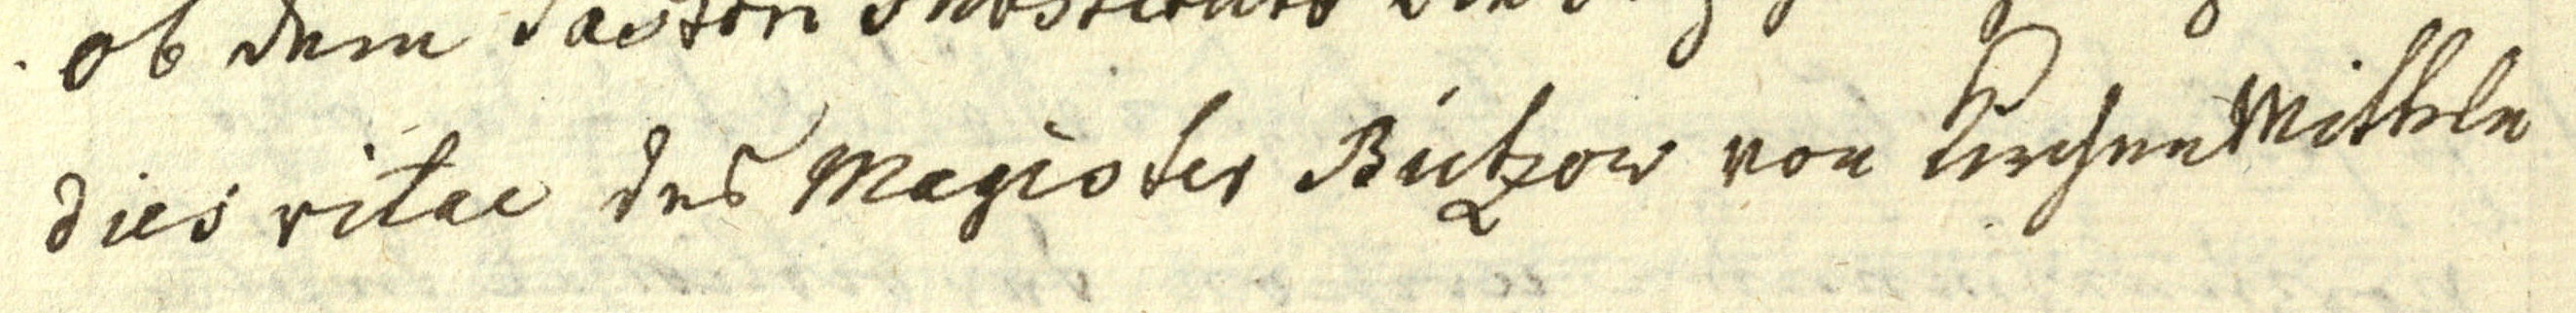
dies vitae des Magister Bützow von KirchenMitteln
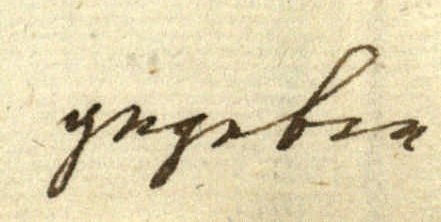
gegeben
